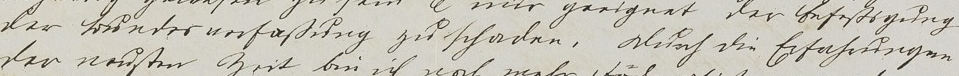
der Bundesverfassung zu schaden. Durch die Erfahrungen
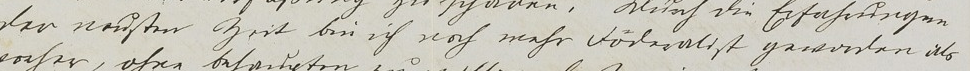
der neusten Zeit bin ich noch mehr Föderalist geworden als
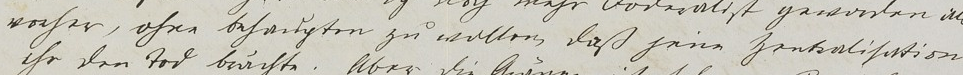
vorher, ohne behaupten zu wollen, daß jene Zentralisation
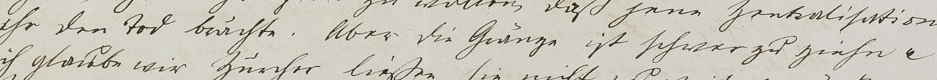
ihr den Tod brächte. Aber die Gränze ist schwer zu ziehn &
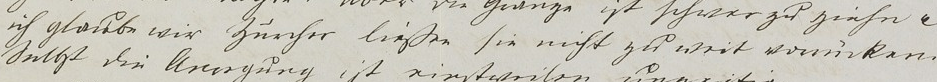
ich glaube wir Zürcher ließen sie nicht zu weit vorrücken.
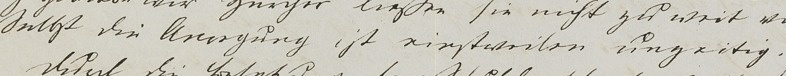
Selbst die Anregung ist einstweilen unzeitig.
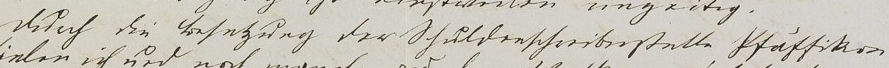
Durch die Besetzung der Schuldenschreiberstelle Pfäffikon
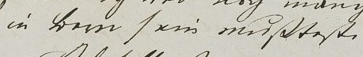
in Bern sein mußtest.
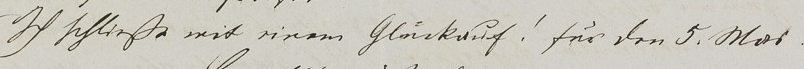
Ich schließe mit einem Glückauf! für den 5. Mai.
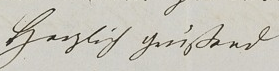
Herzlich grüßend
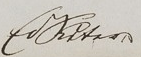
Ed Suter
